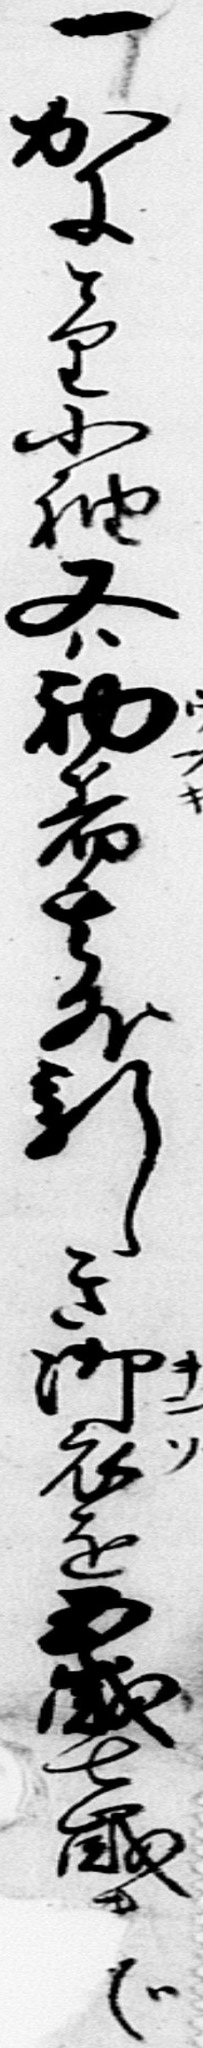一かにとり小袖又は初着其外新しき御衣を五歳七歳まで
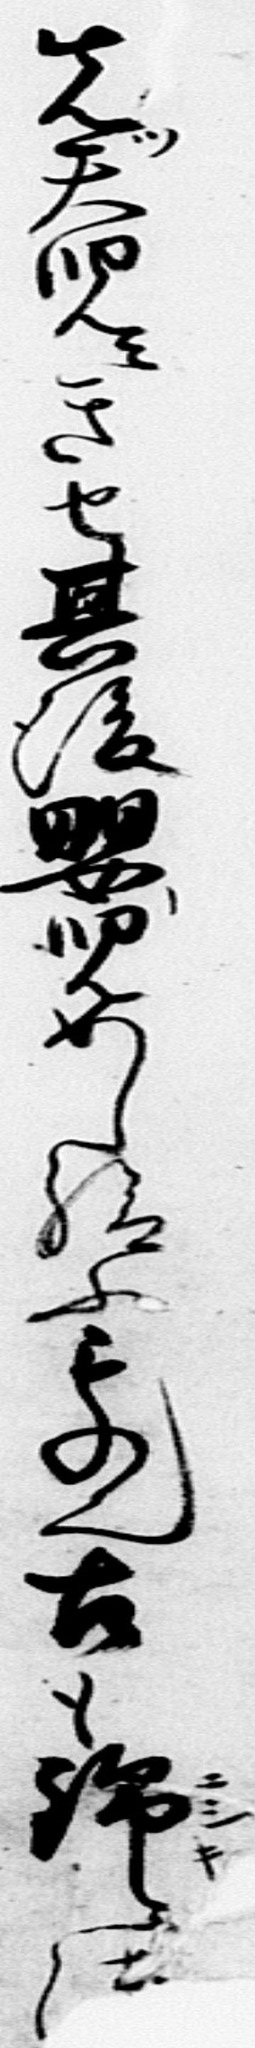先つ天児にきせ其の後嬰児めし給ふもの也古も錦
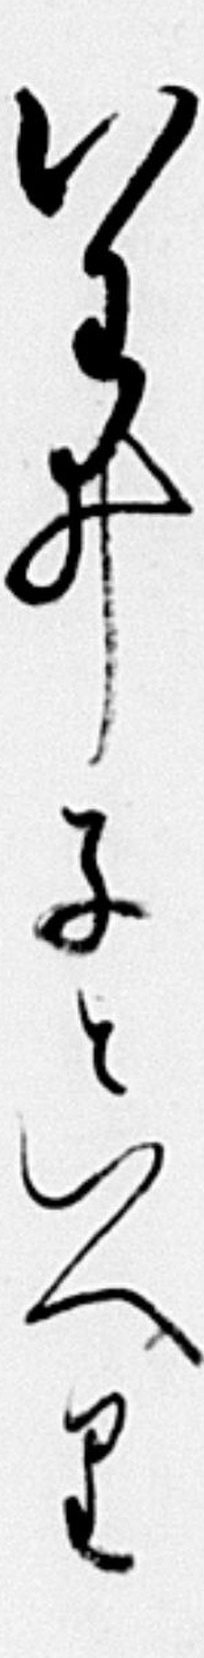いわゐ子といへり
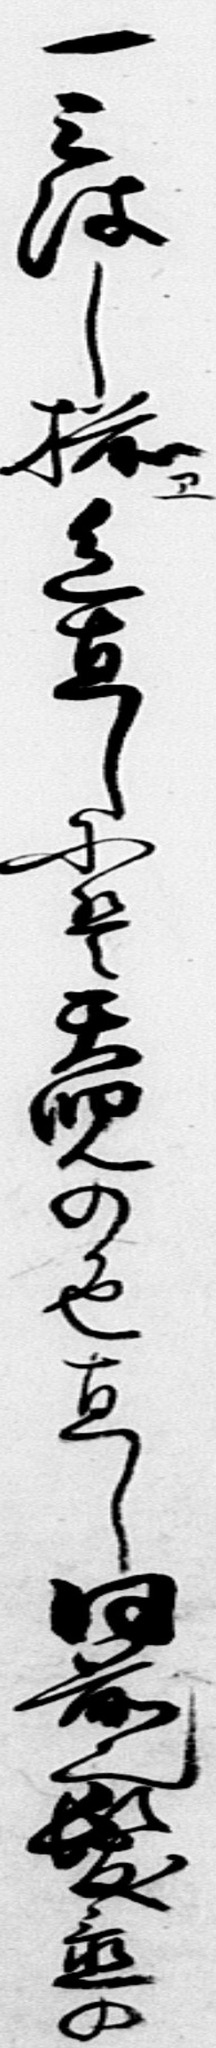一みはし揃え色直しには天児の色直し同前也髪置の
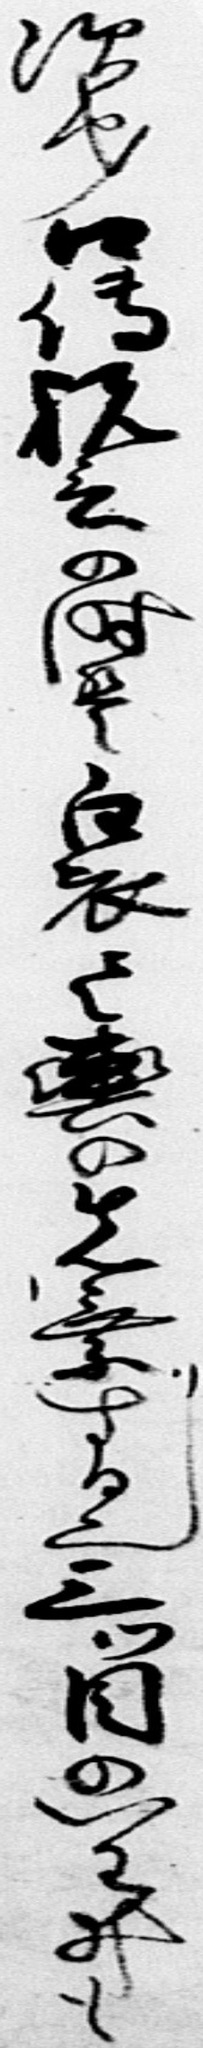次第口伝祝言の時は白衣にて輿の先乗りする也三つ目のいわゐも
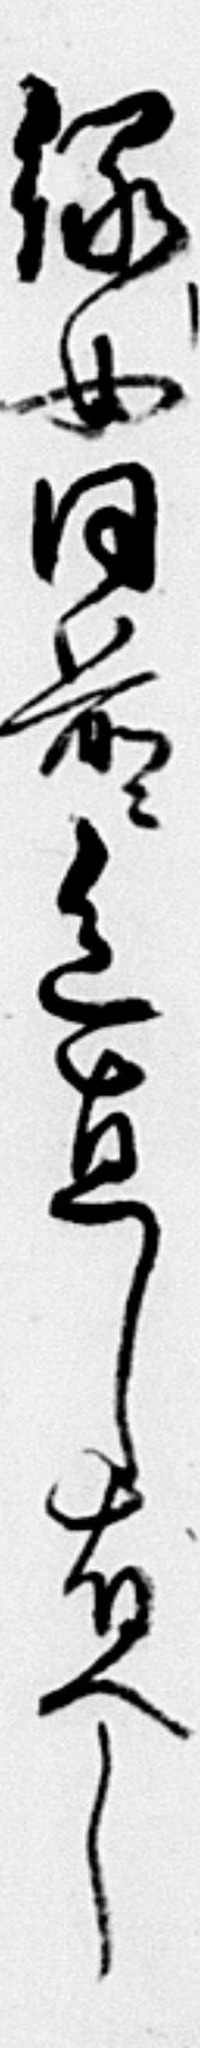縁女同前に色直し有へし
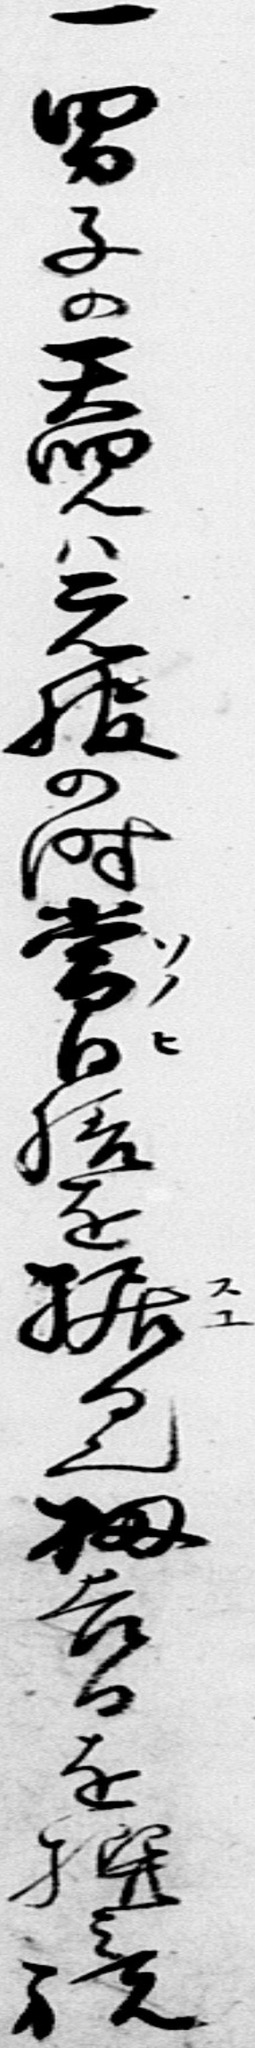一男子の天児は元服の時常日膳を据る也扨吉日を控え祝
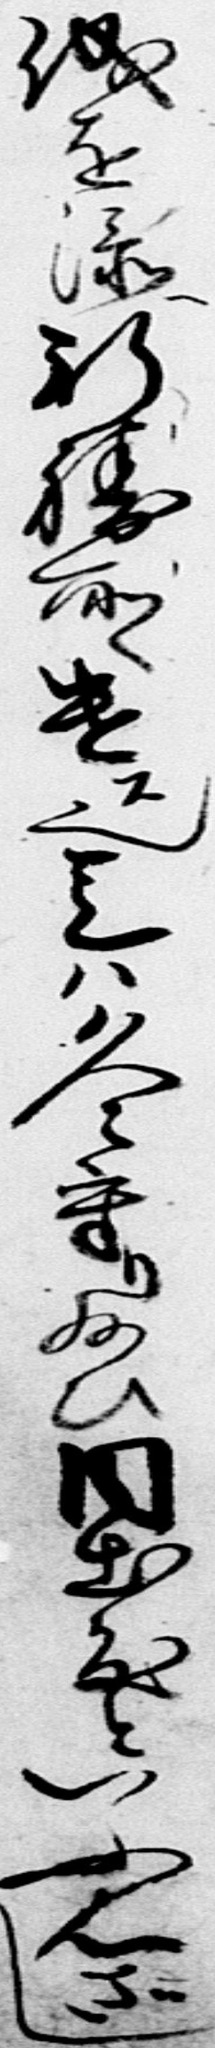儀を添へ祈祷所へ遣す也是は久々守り給ひ目出度といふ心ざし

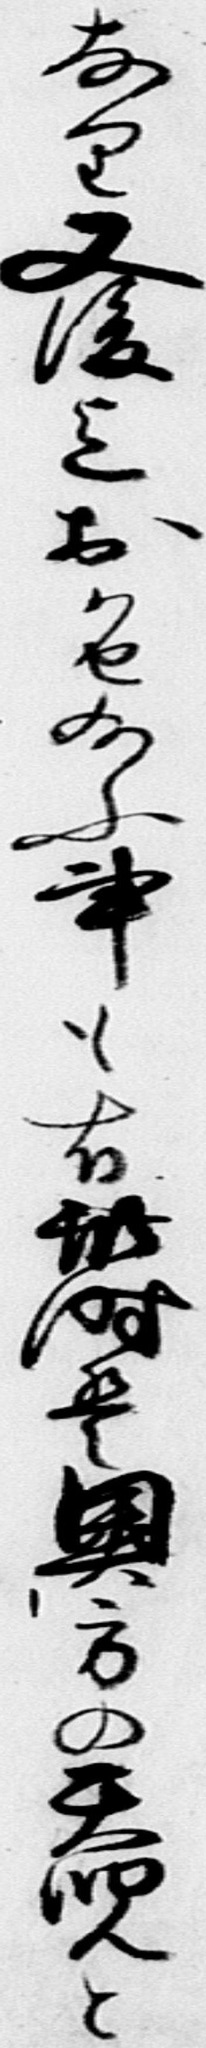なり又後迄おかせ給ふ事も有此時は奥方の天児と
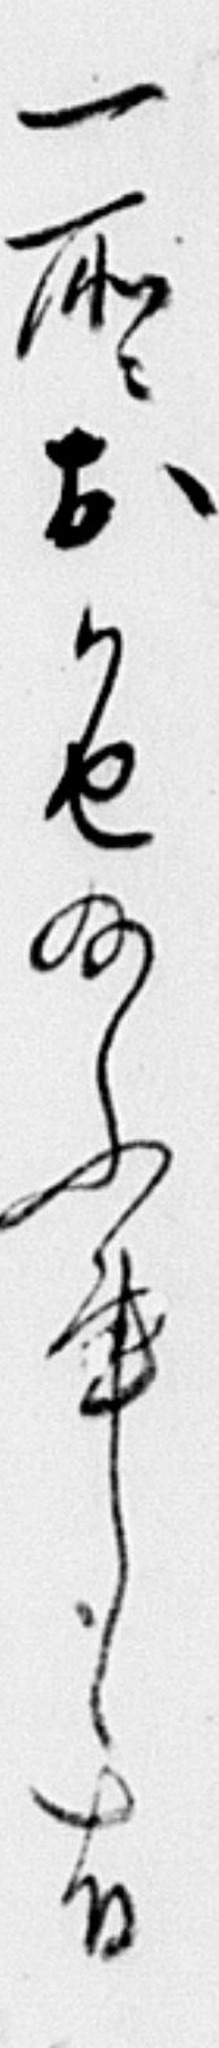一所におかせ給ふ事も有
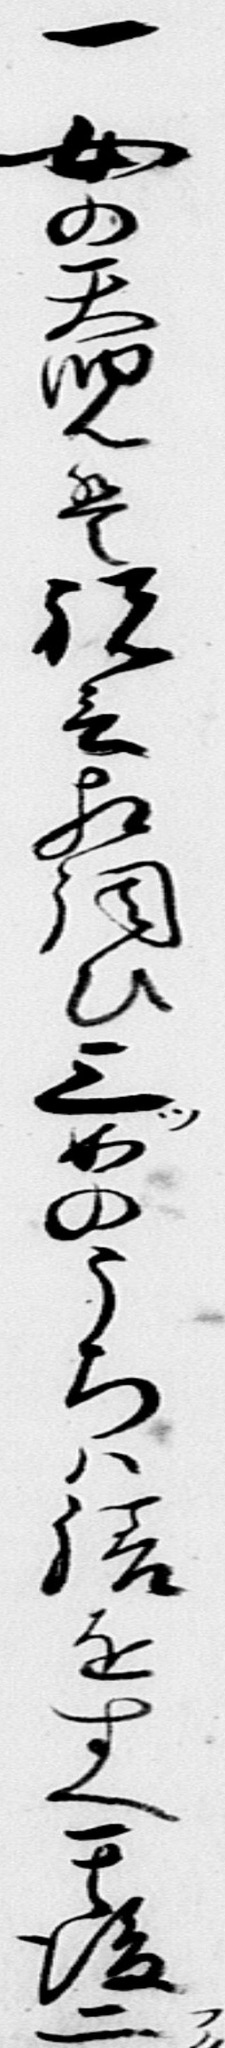一女の天児は祝言相調ひ三つめのうちは膳をすへ其後二
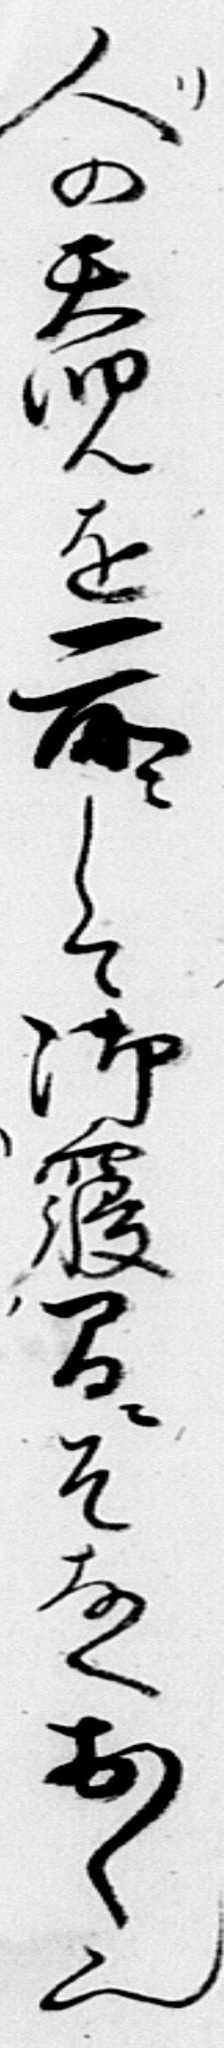人の天児を一所にして御寝間にそなへおく也
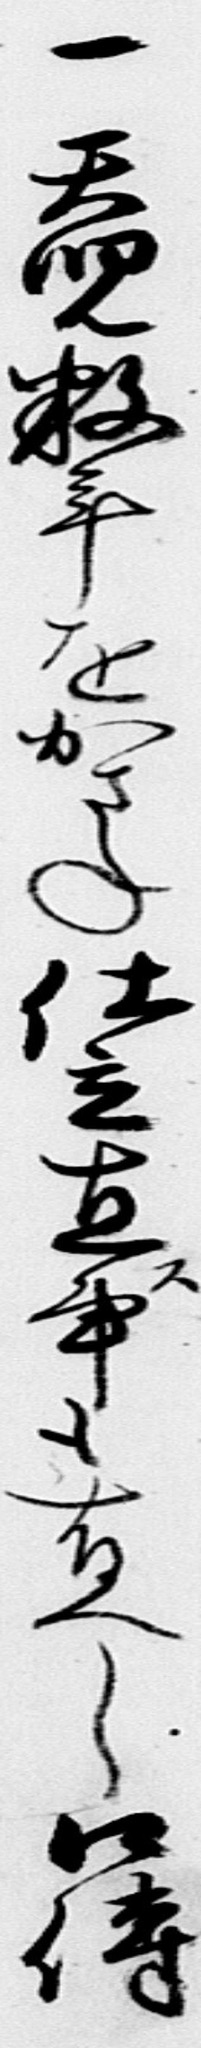一天児数年をかさね仕立直す事も有へし口伝
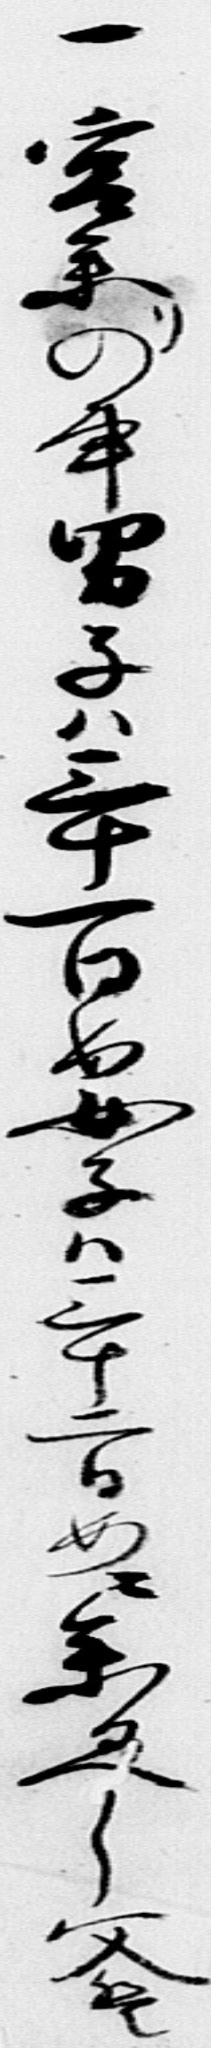一宮参りの事男子は三十一日め女子は三十二日めに参るへし父は
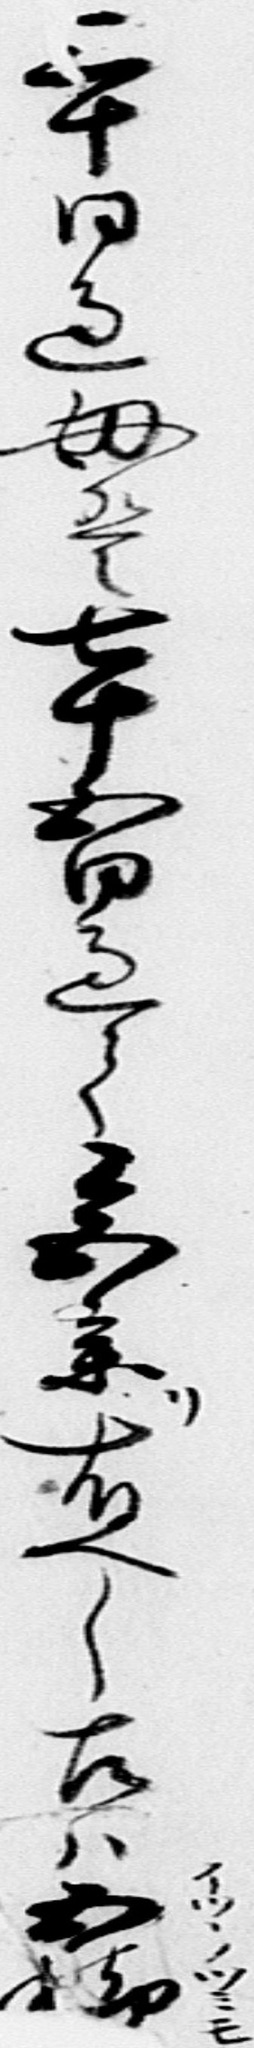三十日過母は七十五日過て宮参り有へし古は五
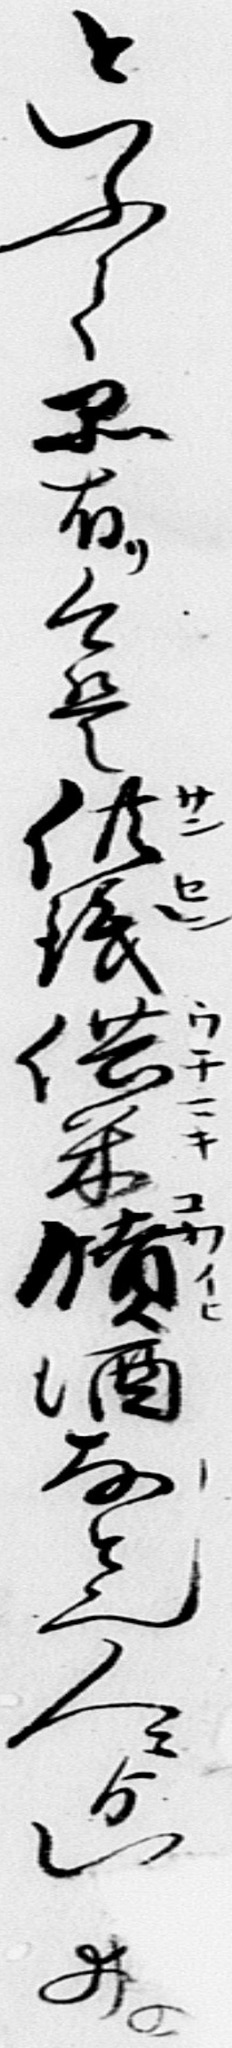といふて品有り今は供銭供米饙酒なと也人によりいゐの
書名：天児之書（あまがつのしょ）
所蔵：徳島県立図書館
